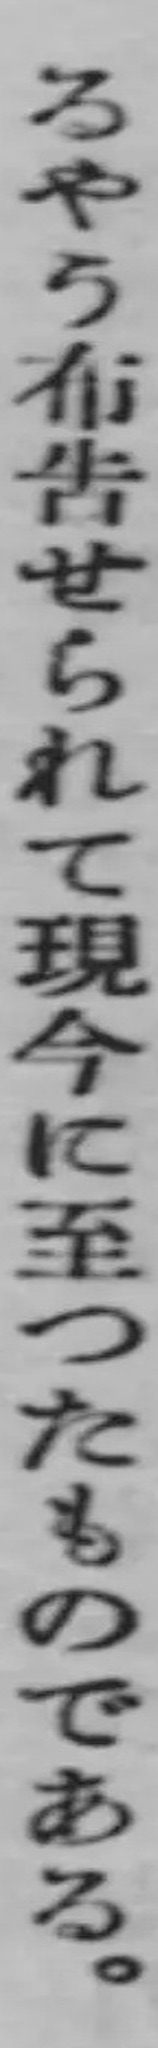るやう布告せられて現今に至つたものである。
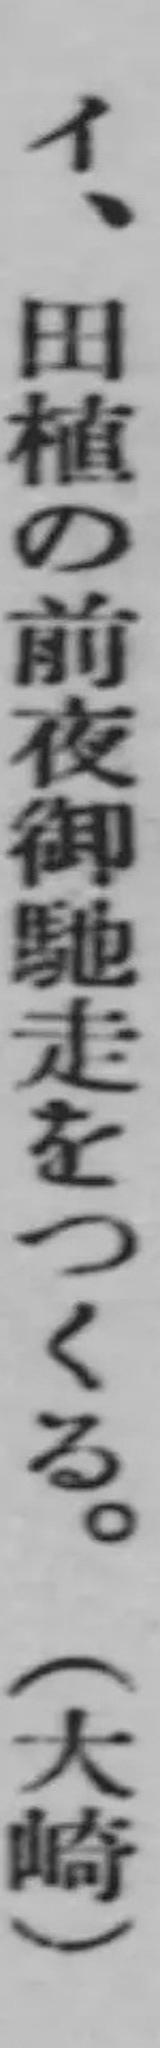イ、田植の前夜御馳走をつくる。(大崎)
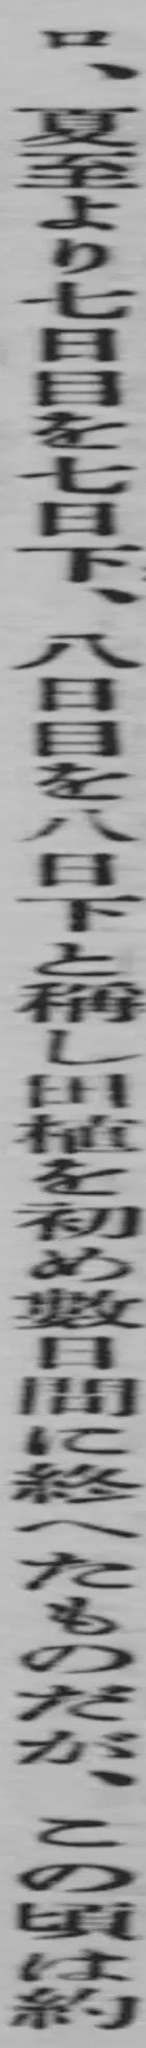ロ、夏至より七日間を七日下、八日目を八日下と稱し田植を初め數日間に終へたものだが、この頃は約
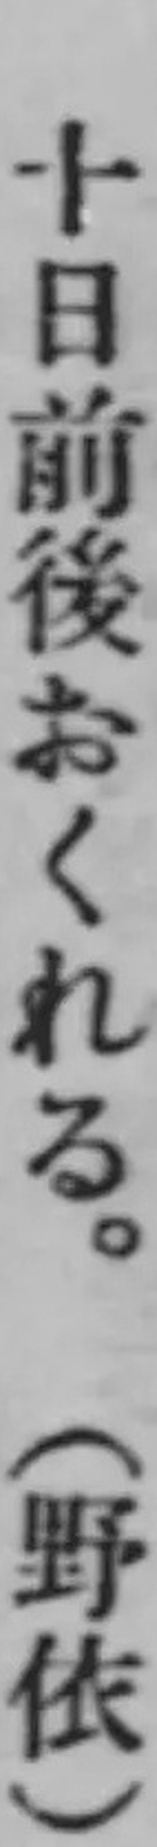十日前後おくれる。(野依)
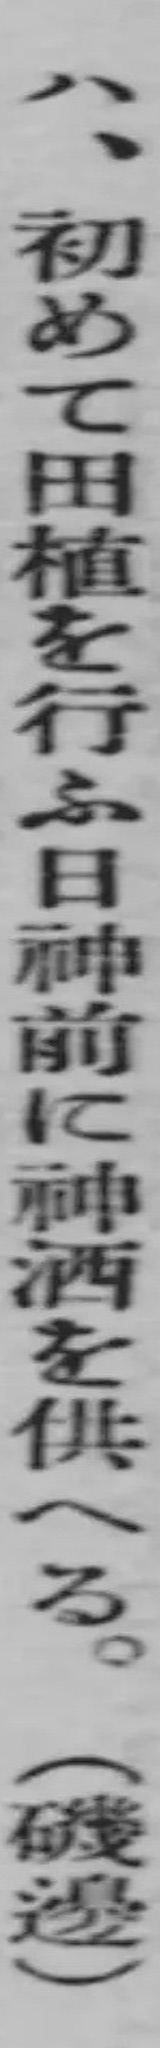ハ、初めて田植を行ふ日神前に神酒を供へる。(磯邊)
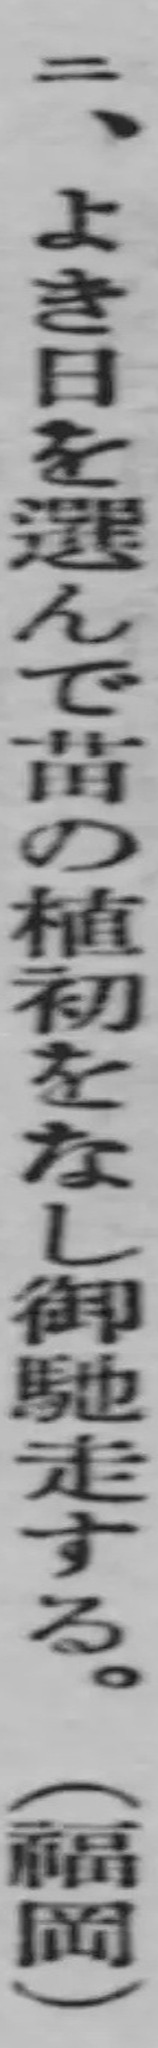ニ、よき日を選んで苗の植初をなし御馳走する。(福岡)
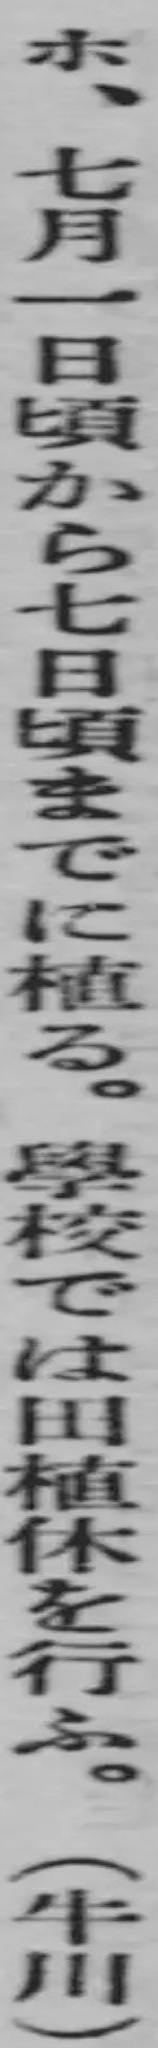ホ、七月一日頃から七日頃までに植る。樂校では田植休を行ふ。(牛川)
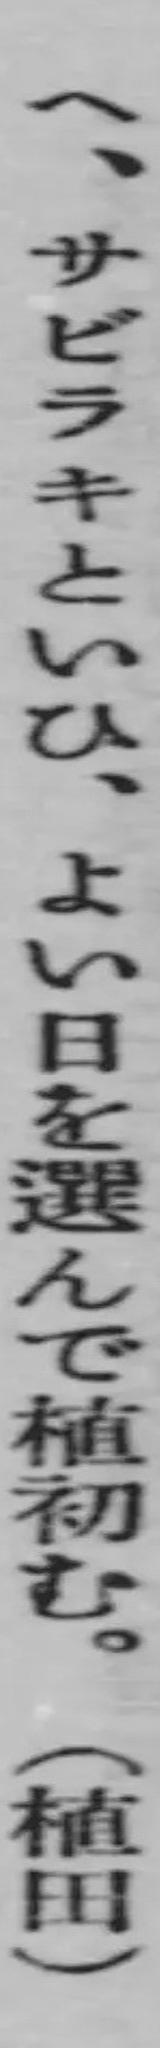ヘ、サビラキといひ、よい日を選んで植初む。(植田)
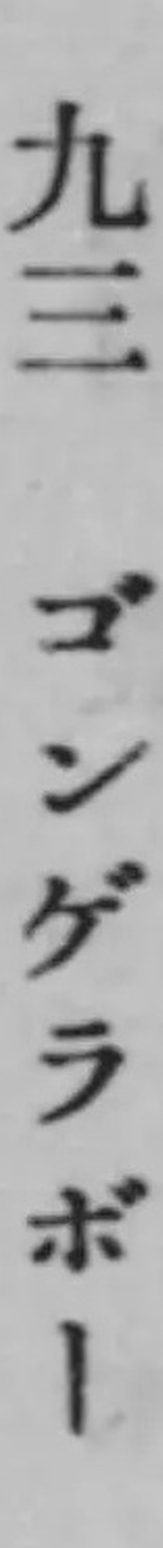九三ゴンゲラボー
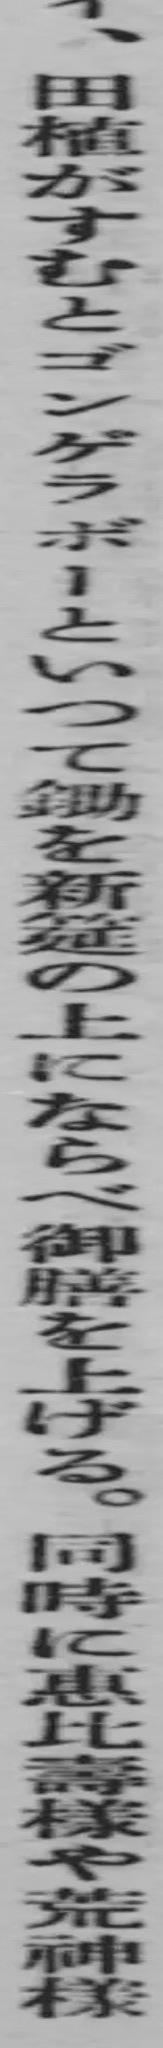イ、田植がすむとゴンゲラボーといつて鋤を新筵の上にならべ御膳を上げる。同事に惠比壽様や荒神様
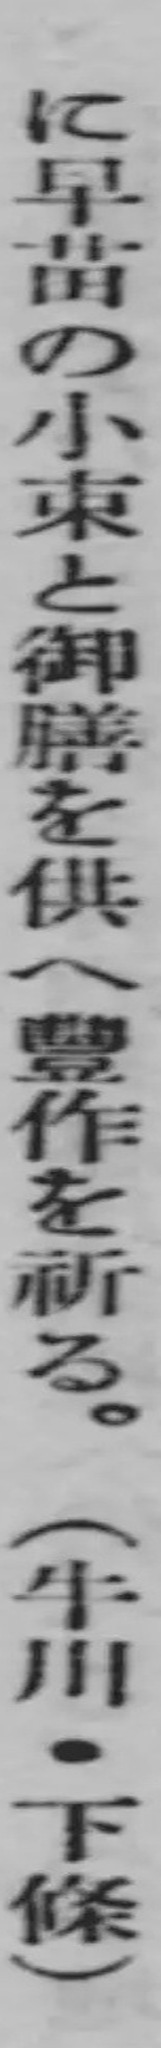に早苗の小束と御膳を供へ豐作を祈る。(牛川・下條)

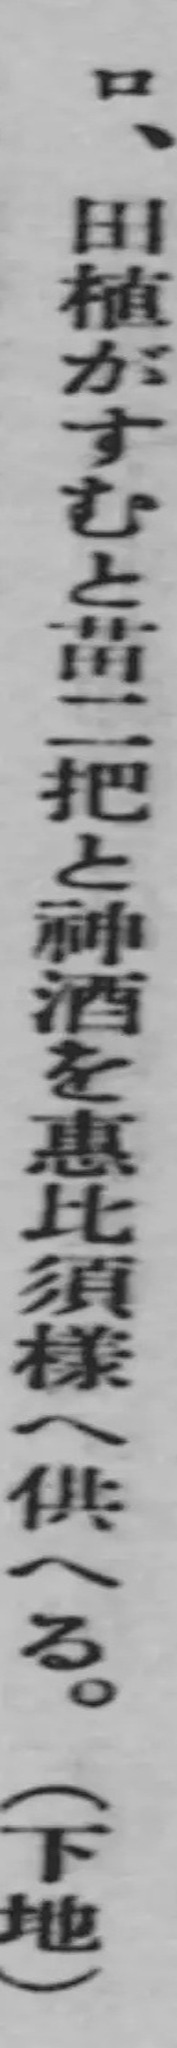ロ、田植がすむと苗二把と神酒を惠比須様へ供へる。(下地)
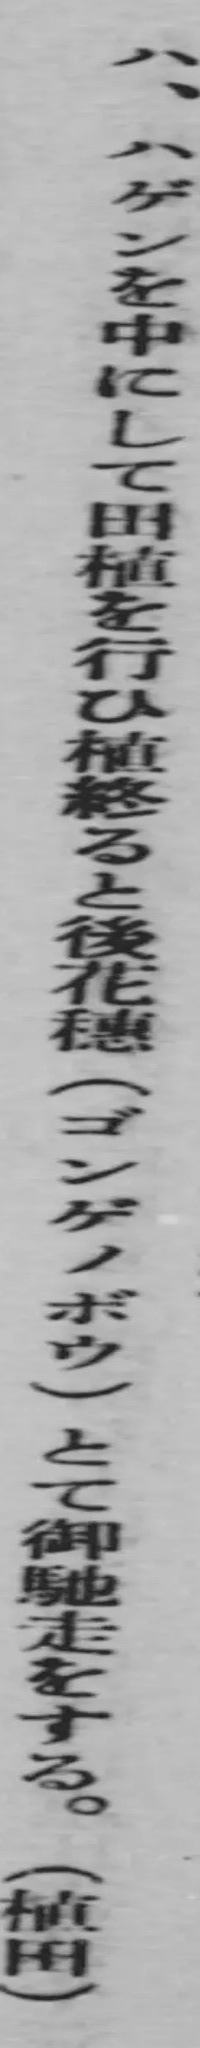ハ、ハゲンを中にして田植を行ひ植終ると後花穗(ゴンゲノボウ)とて御馳走する。(植田)
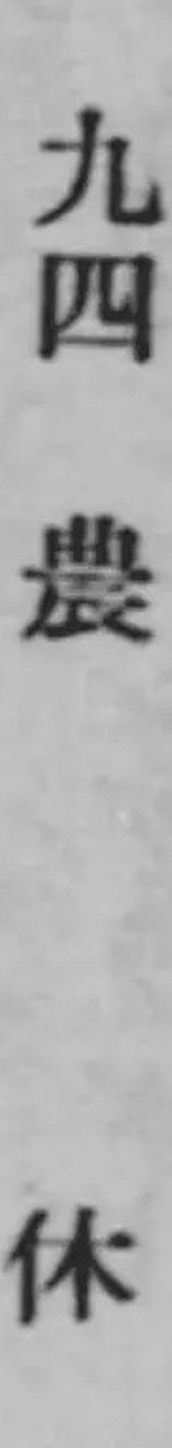九四農休
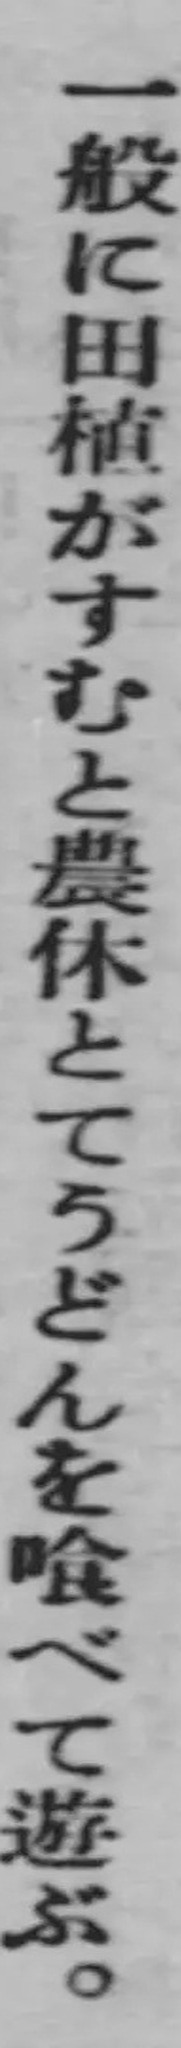一般に田植がすむと農休とてうどんを喰べて遊ぶ。
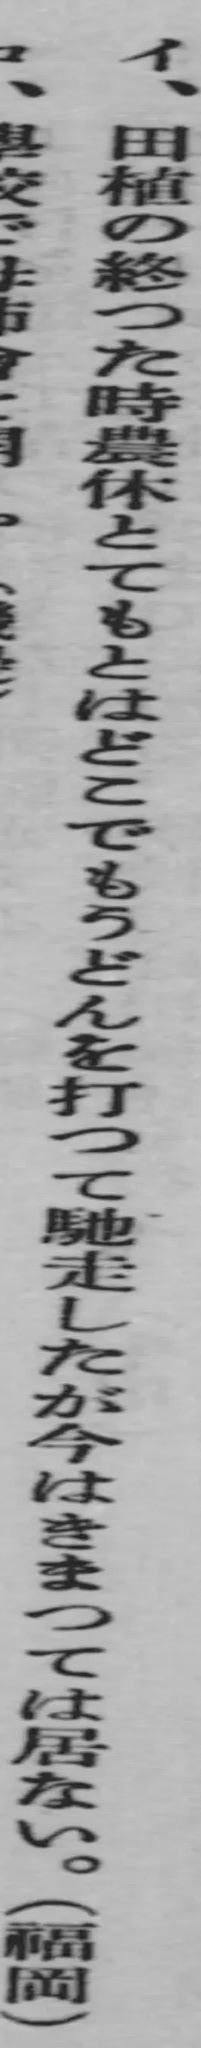イ、田植の終つた時農休とてもとはどこでもうどんを打つて馳走したが今はきまつては居ない。(福岡)
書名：豊橋の年中行事
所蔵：国立国会図書館 National Diet Library, JAPAN
